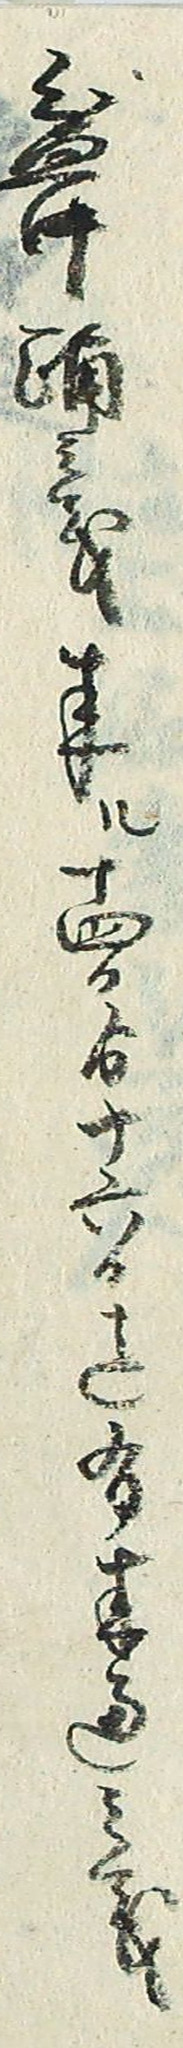盆中踊之義来る十四日より十六日迄有来通之義
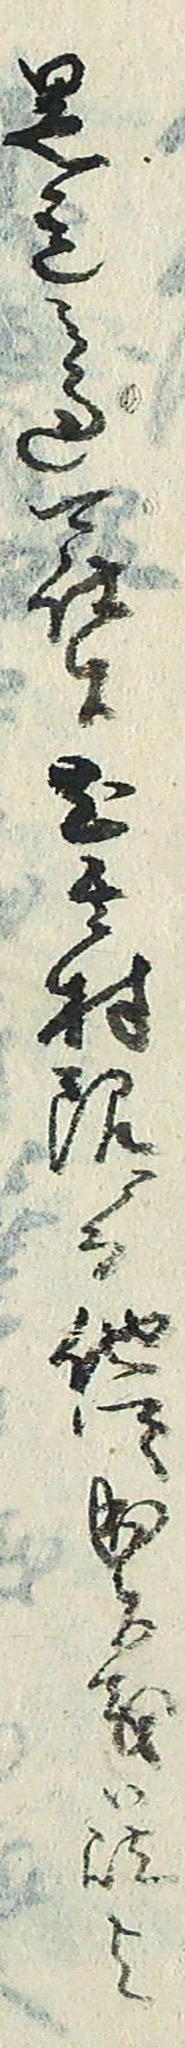是迄之通可仕候尤其村限に而他郷へ出候義は屹と
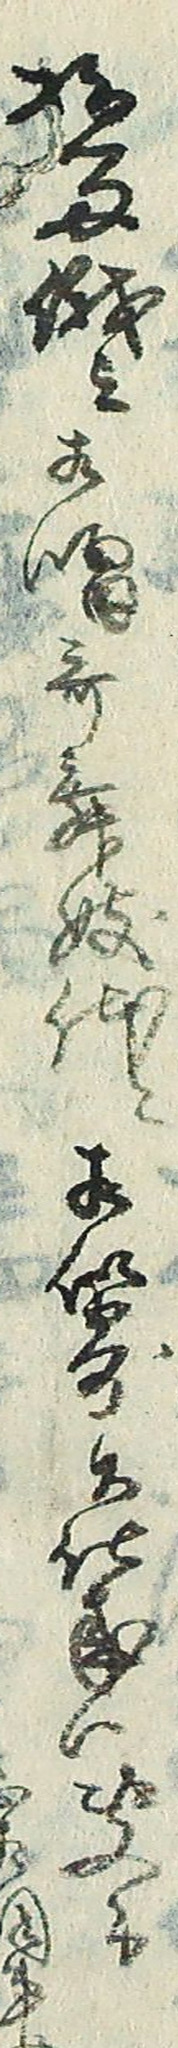指留俄と相唱哥舞伎体に相似寄候仕成は決而
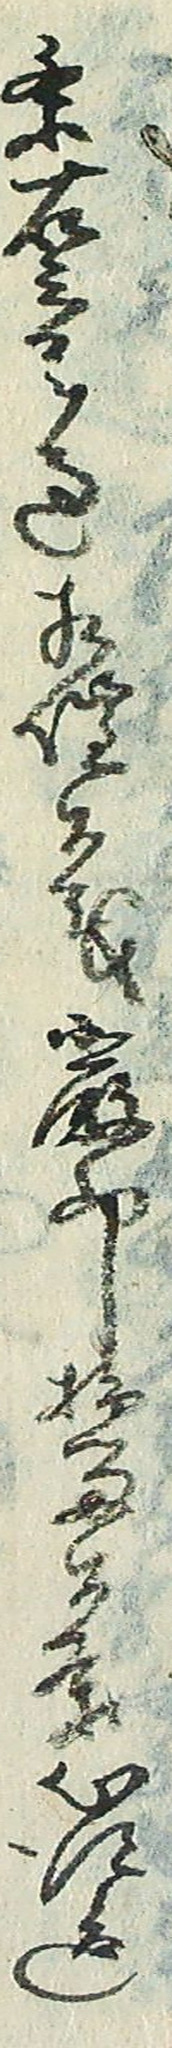条右三日を過相催候義厳布指留候条心得違
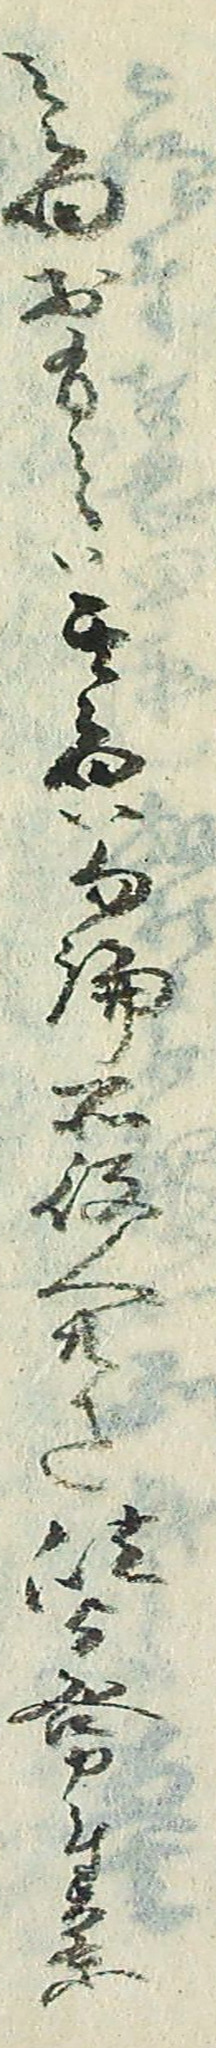之者於有之は其者は勿論所役人共迄屹と咎申付候条
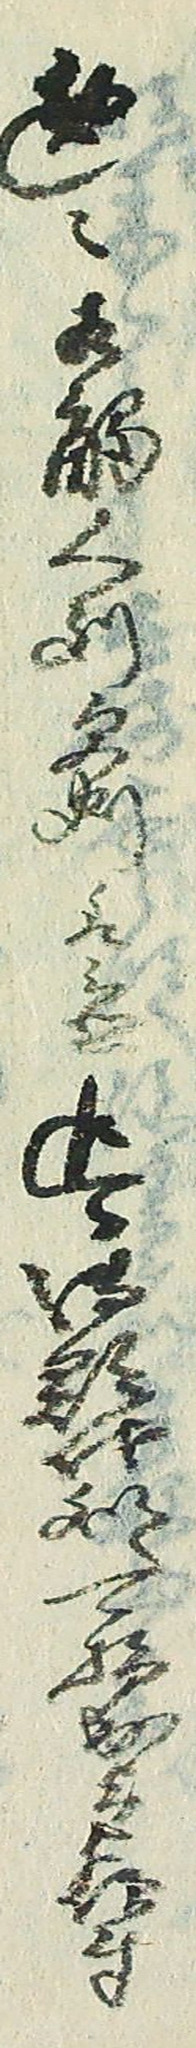逸々相触人別受判取置追而御郡代処へ可指出旨被仰付
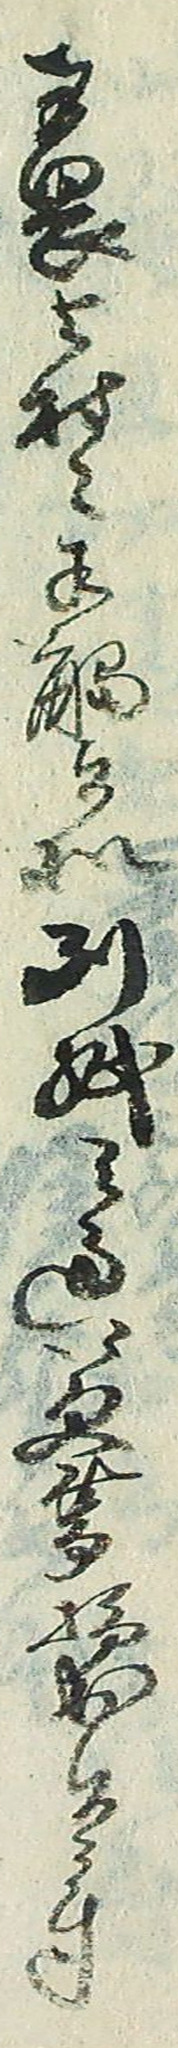奉畏与村々相触候処別紙之通御受書指出候に付
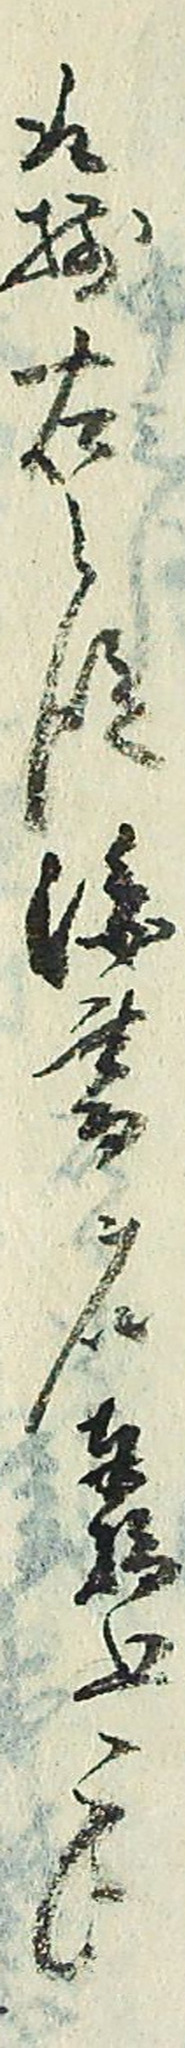取揃右之段添書を以奉指上候以上
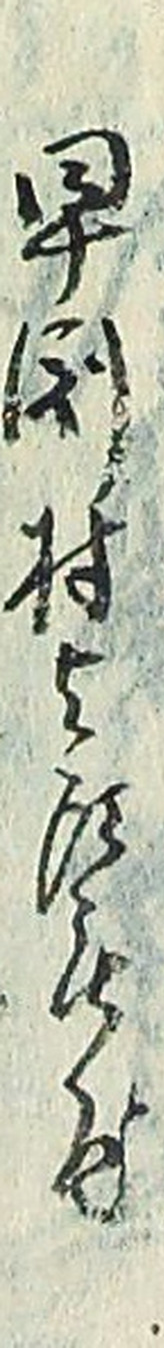早渕村与頭庄屋
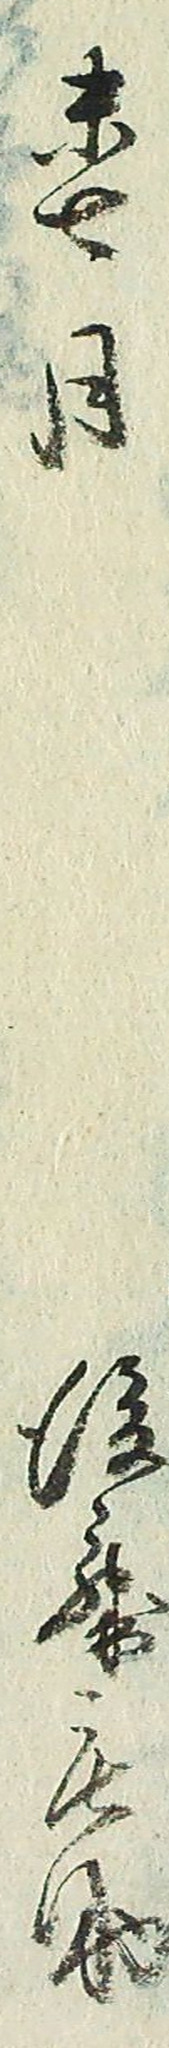未七月後藤庄助
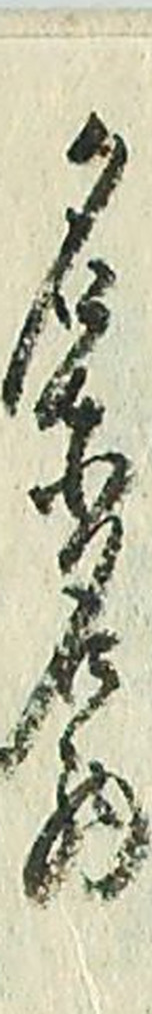名東名西
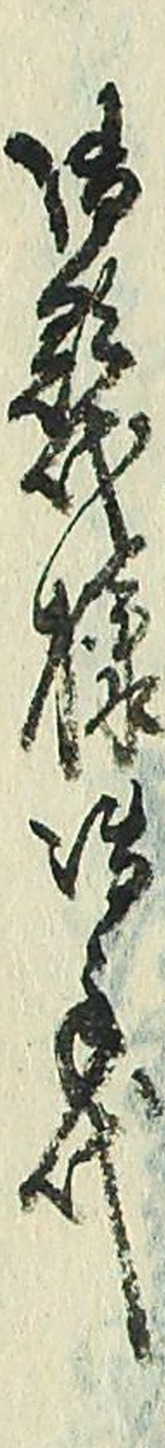御郡代様御手代
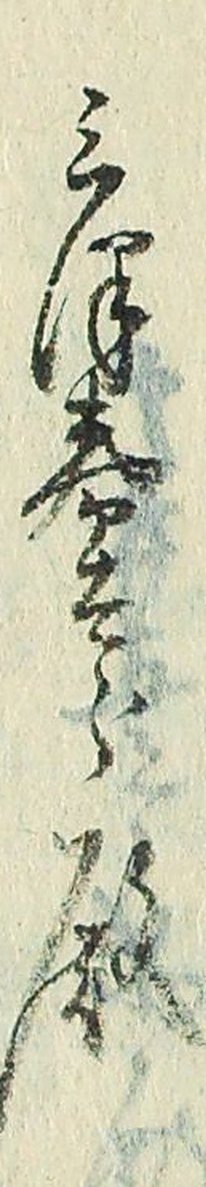三沢春太郎殿
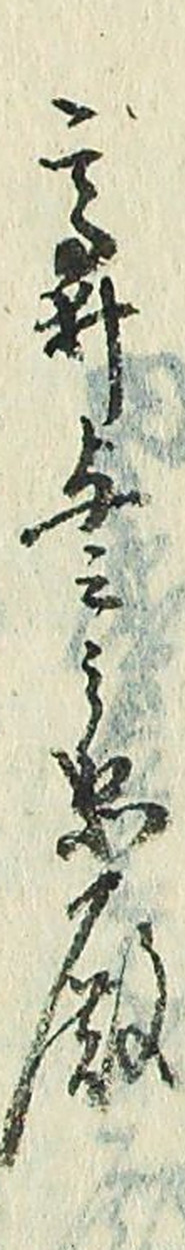高井与三兵衛殿
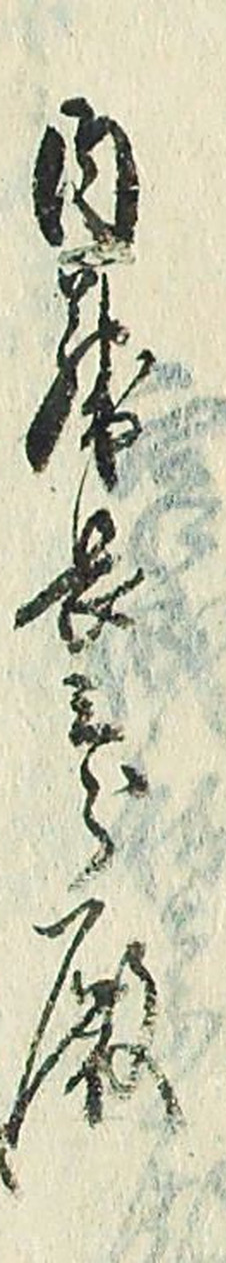内藤長三郎殿
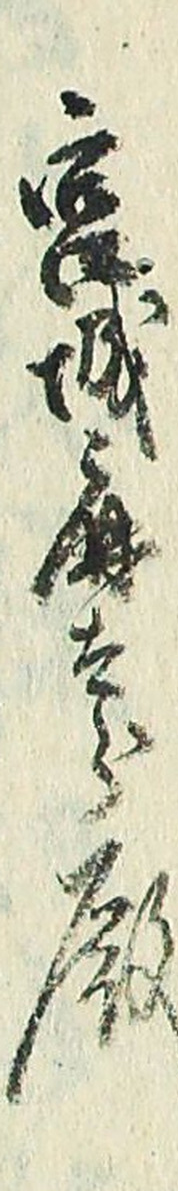宮城麻太郎殿
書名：諸御用御□受書控
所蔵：鳴門教育大学 Naruto University of Education
